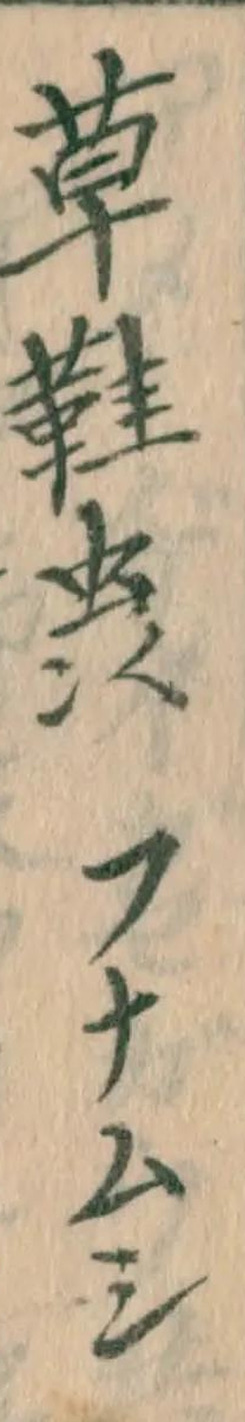草鞋蟲フナムシ
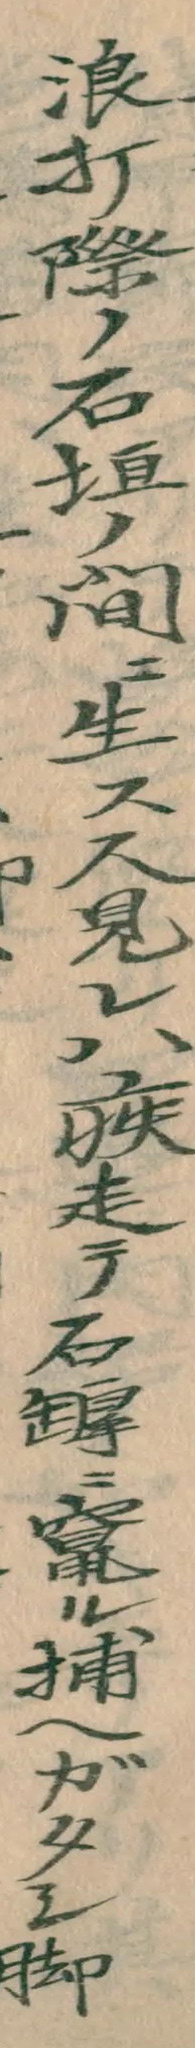浪打際ノ石垣ノ間ニ生ス人見レハ疾走テ石罅ニ竄ル捕ヘガタシ脚
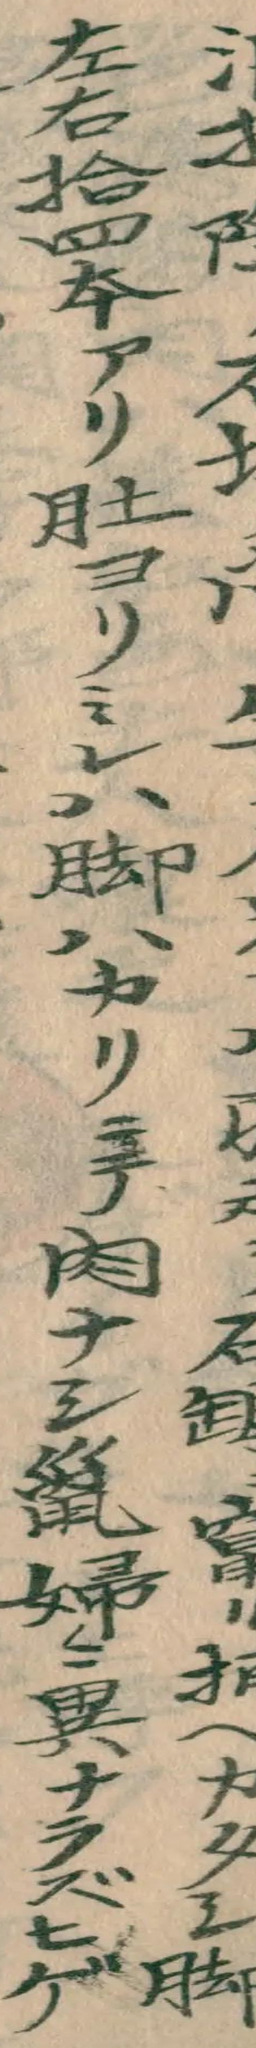左右拾四本アリ肚ヨリミレハ脚ハカリニテ肉ナシ鼠婦ニ異ナラズヒゲ
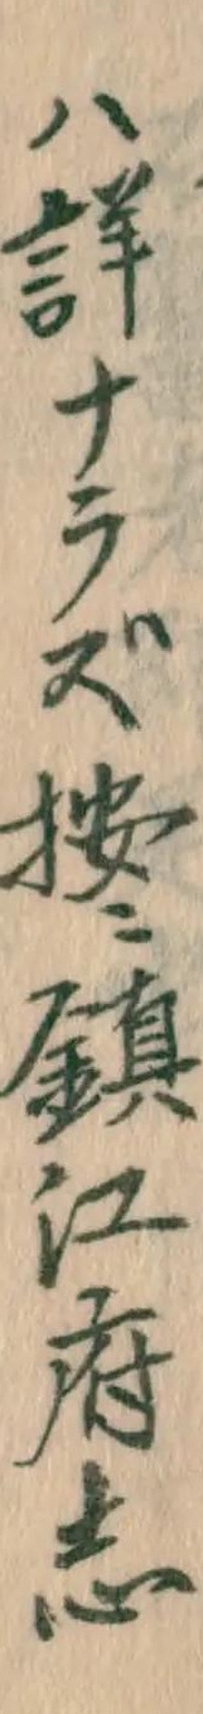ハ詳ナラズ按ニ鎮江府志
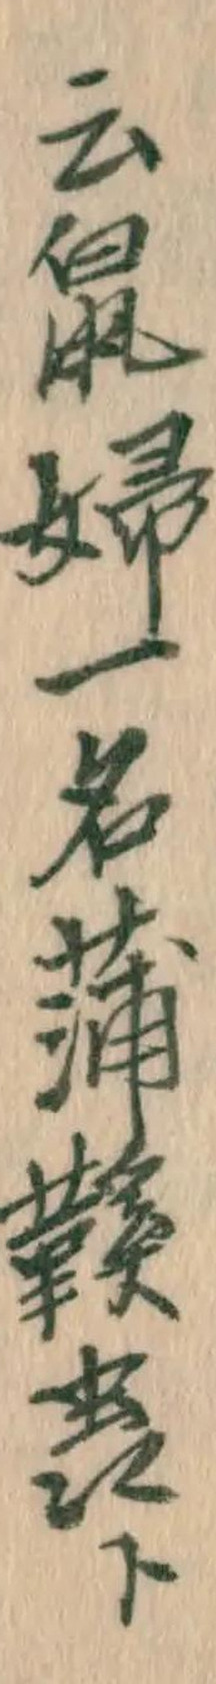云鼠婦一名蒲鞵蟲ト
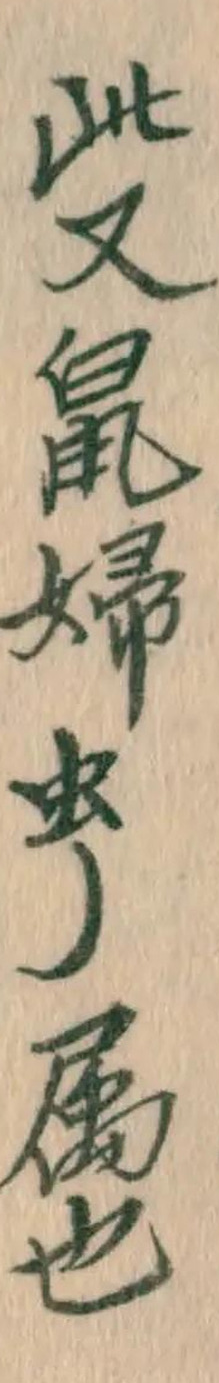此又鼠婦虫ノ属也
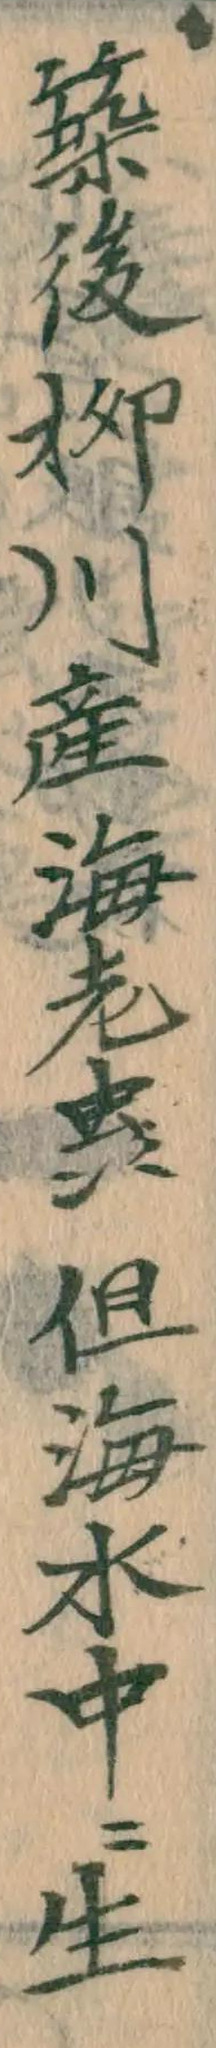築後柳川産海老蟲但海水中ニ生

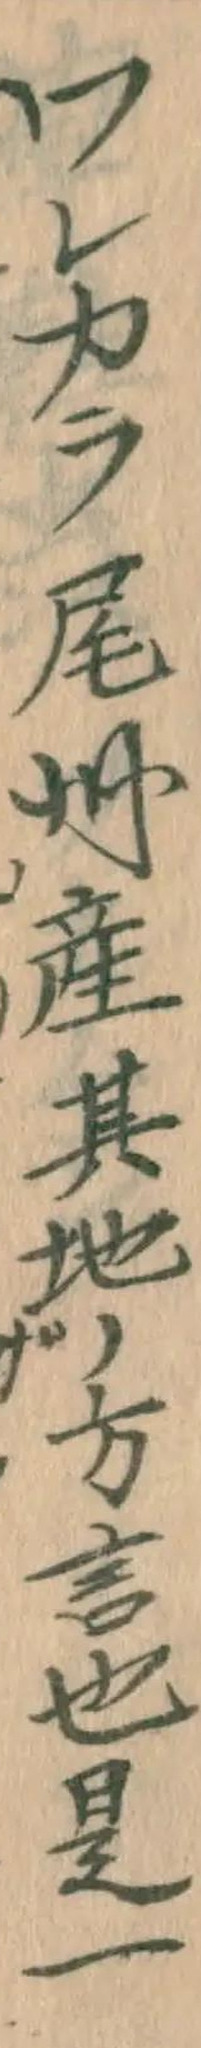ワレカラ尾州産其地ノ方言也是一
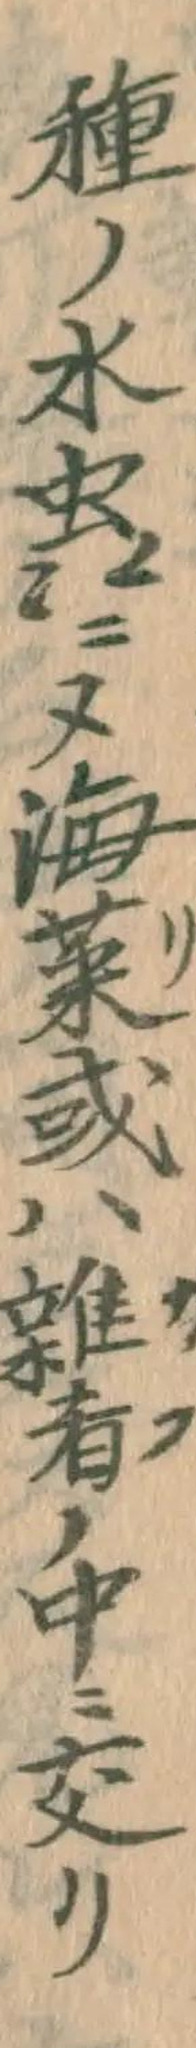種ノ水蟲ニシテ海菜或ハ雑者ノ中ニ交リ
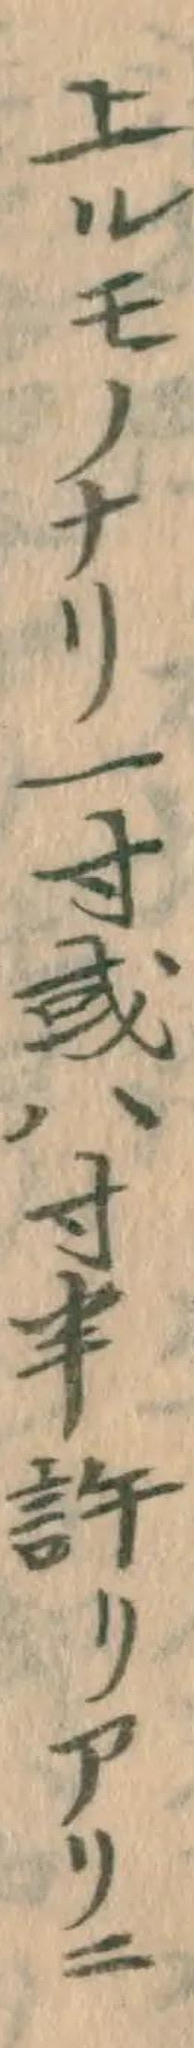上ルモノナリ一寸或ハ寸半許リアリ二
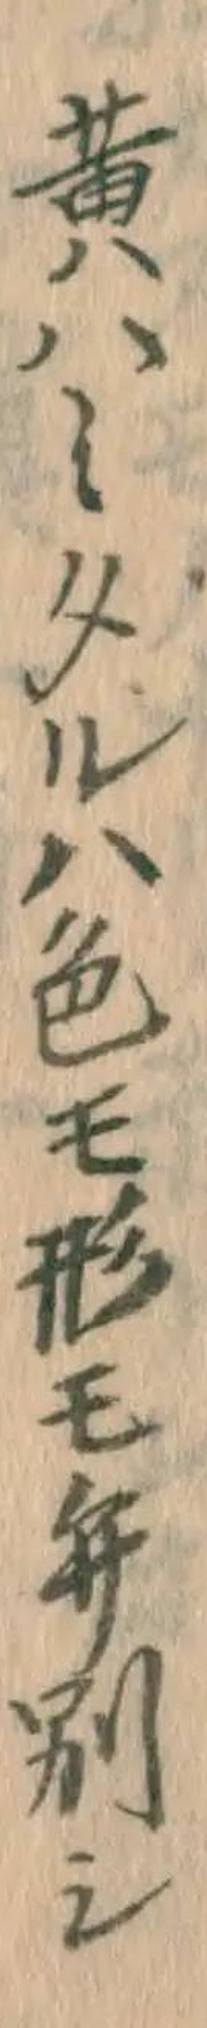黄ハミタルハ色モ形モ弁別シ
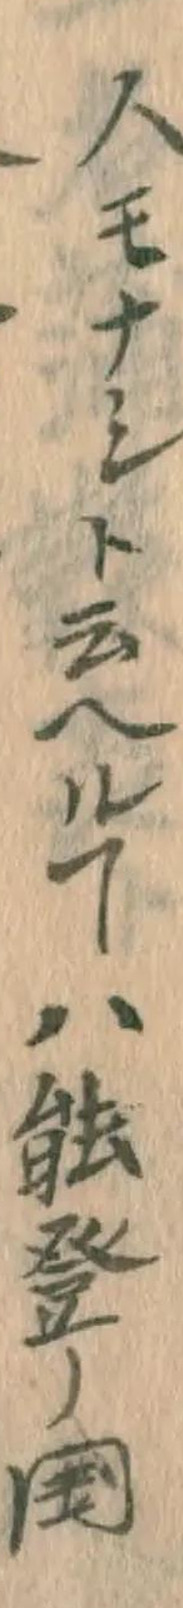人モナシト云ヘルコトハ能登ノ国
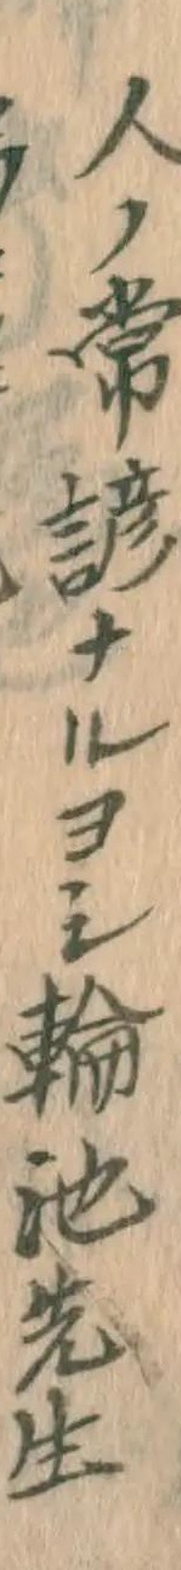人ノ常諺ナルヨシ輪池先生
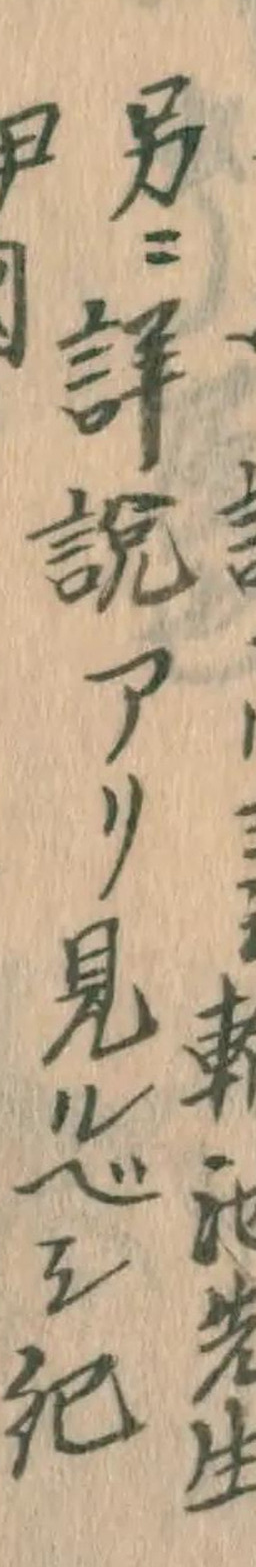別ニ詳説アリ見ルベシ紀
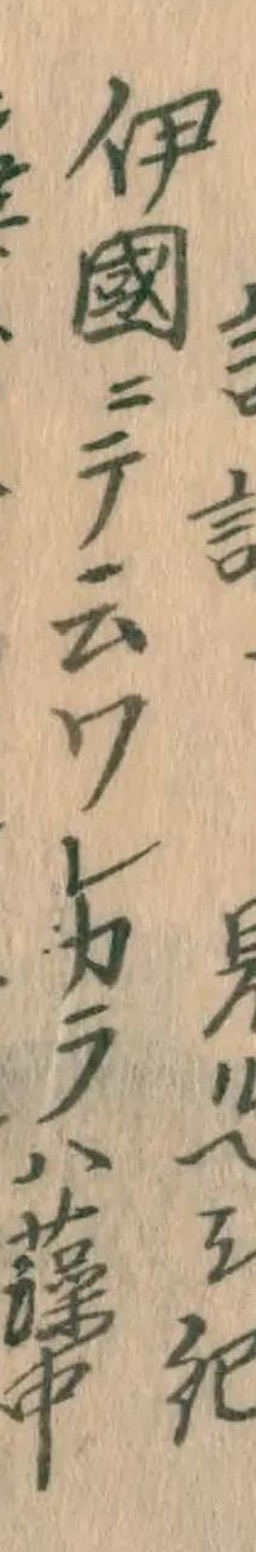伊國ニテ云ワレカラハ藻中
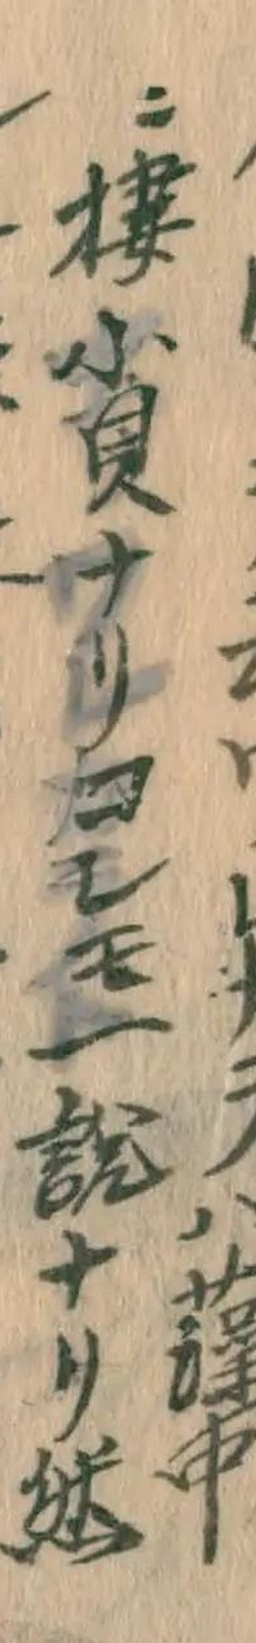ニ棲小貝ナリコレモ一説ナリ然
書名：千蟲譜 3巻. [1]
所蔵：国立国会図書館 National Diet Library, JAPAN
